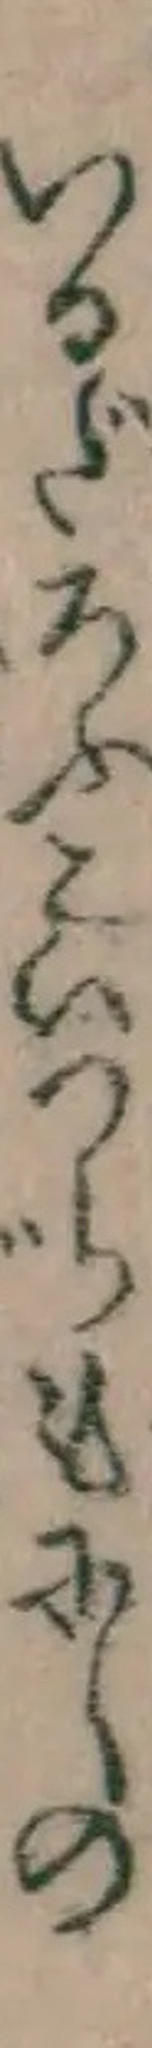いるだろふこいつらもにしの
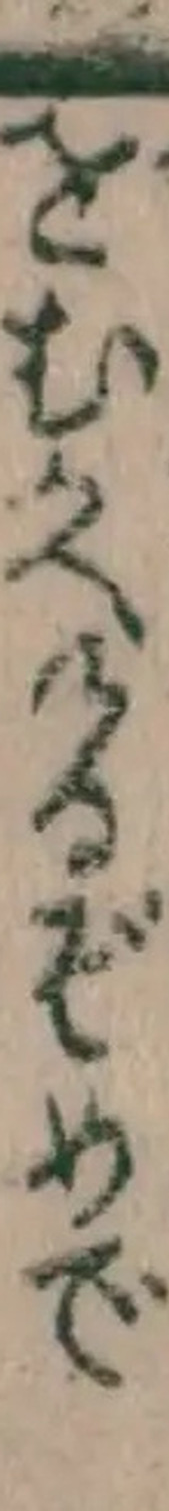をむかへけるぞめで
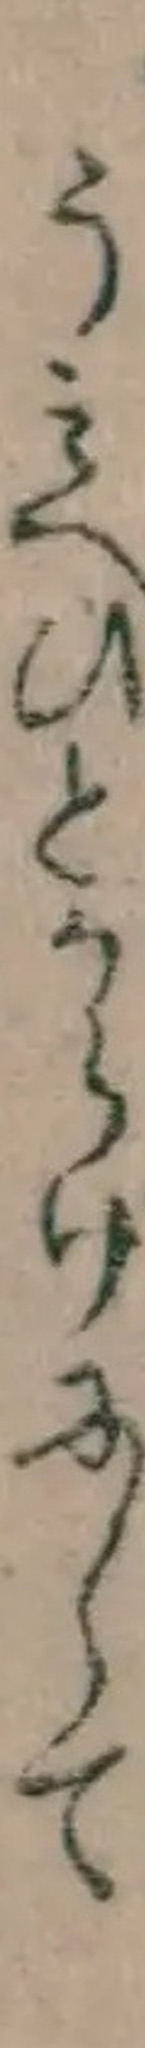うみへひとからげにして
